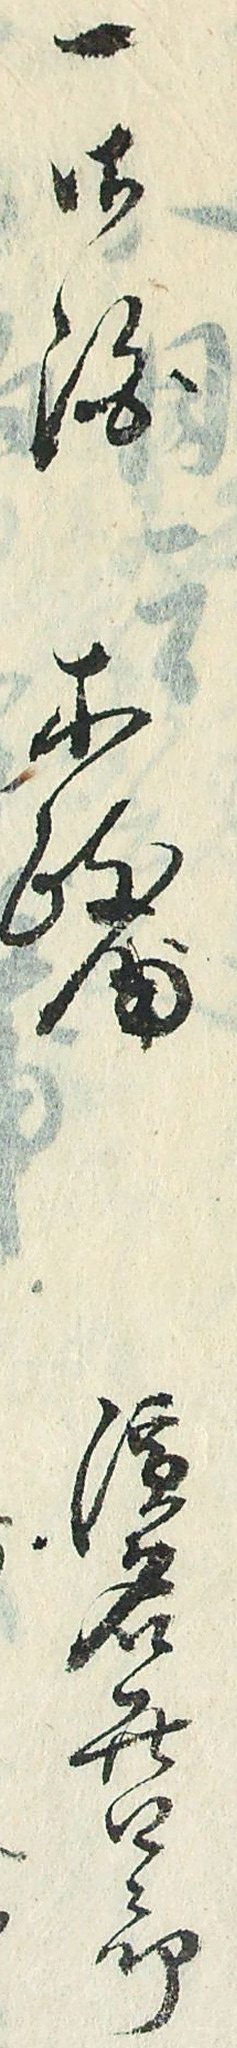一御泊木岐浦浜名并四郎

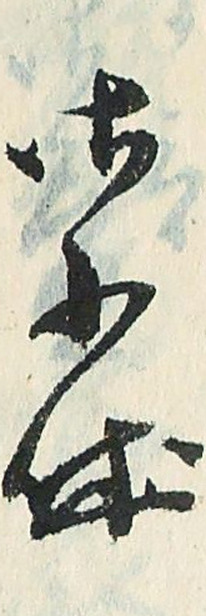御小休
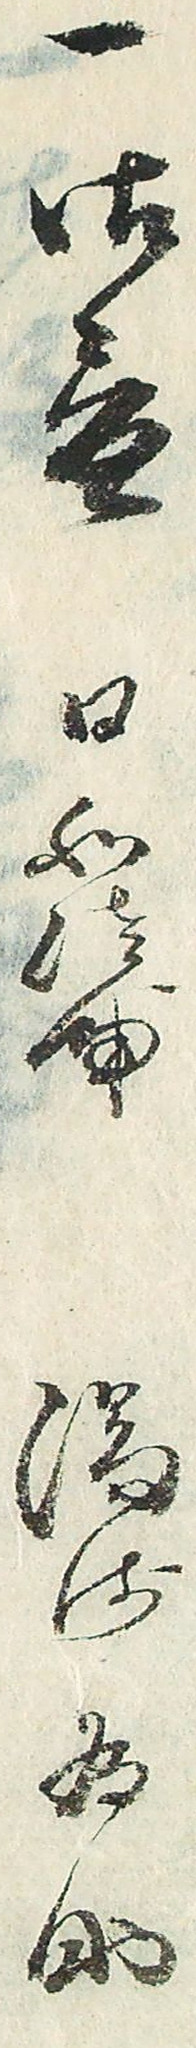一御昼日和佐浦湯浅為助
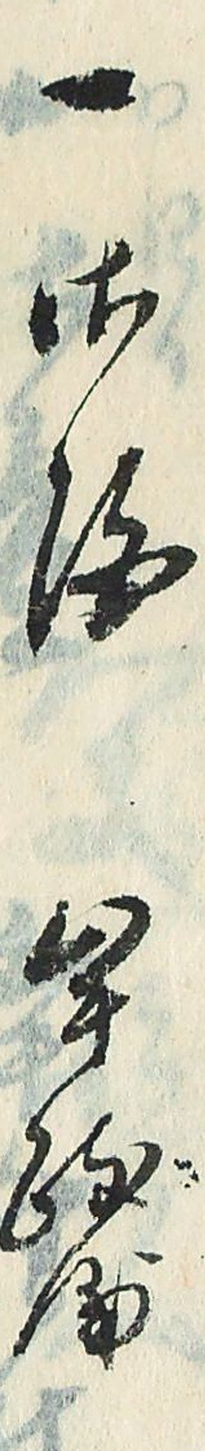一御泊牟岐浦
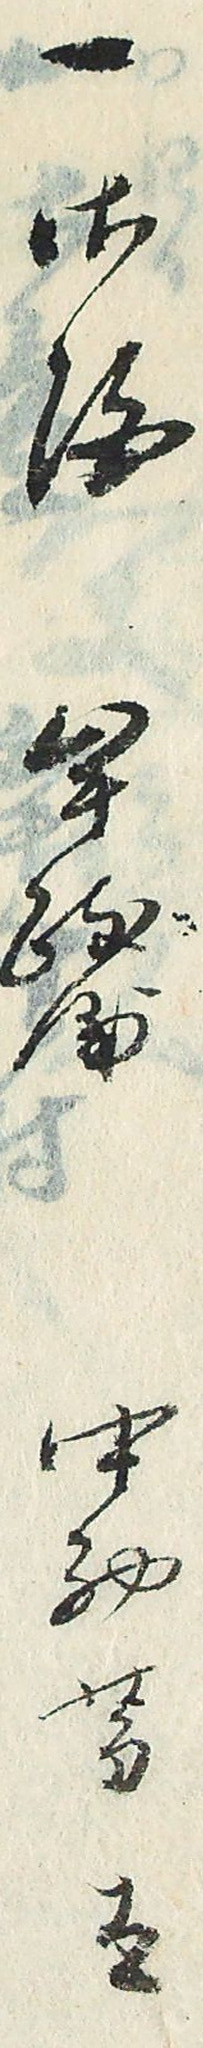一御泊牟岐浦中神芳吉
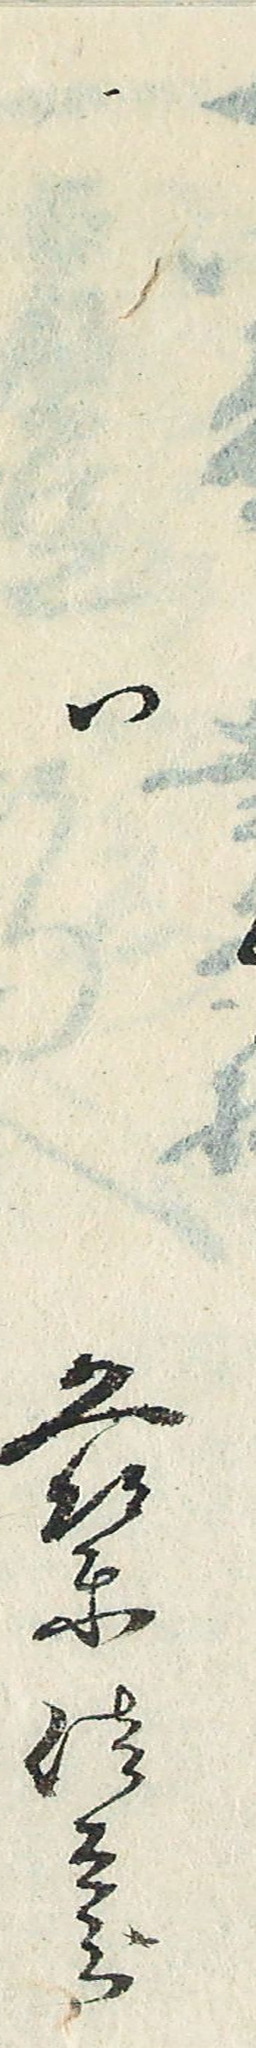同久須米佐太郎
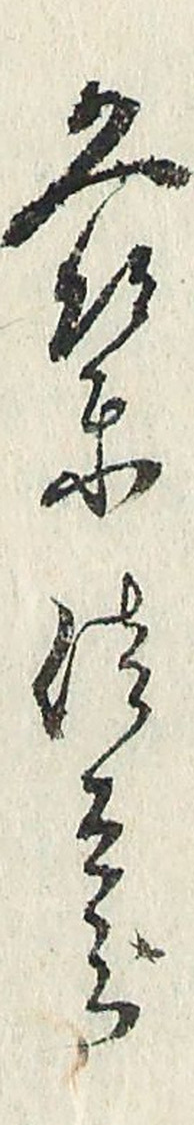同久須米佐太郎
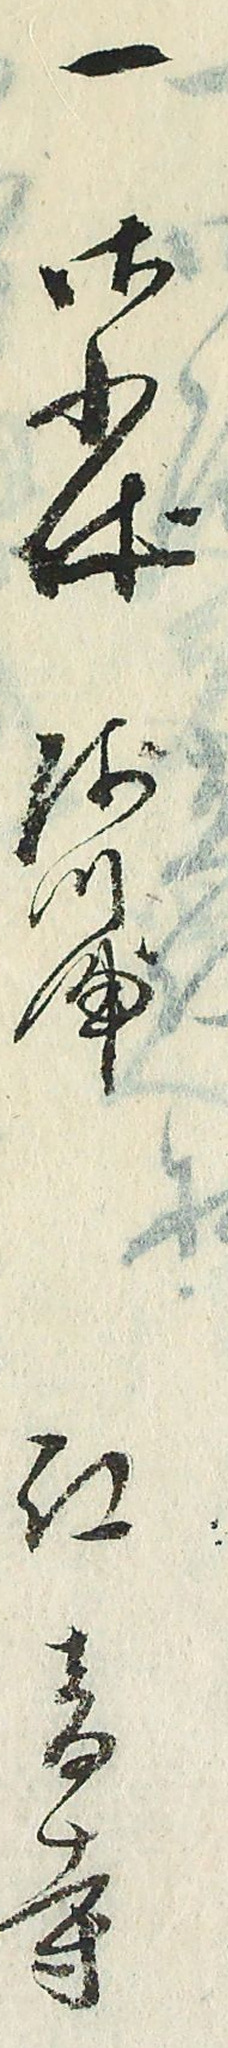一御小休浅川浦江音寺
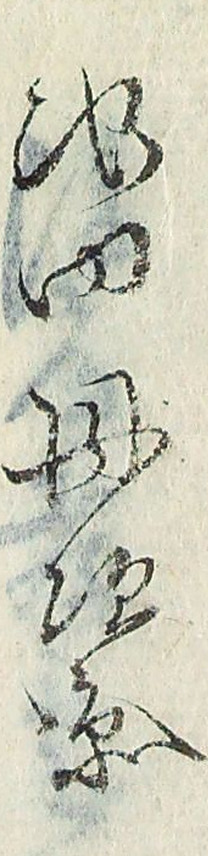同池内丹次兵衛
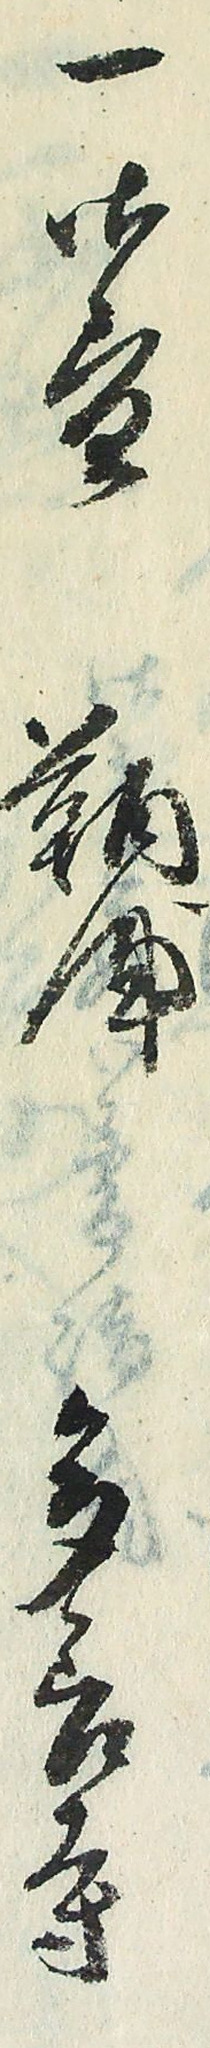一御昼鞆浦多善寺
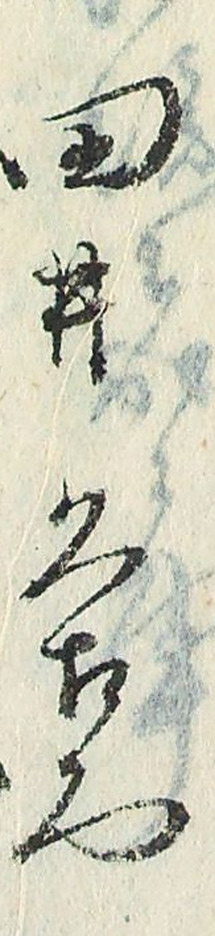同田井久左衛門
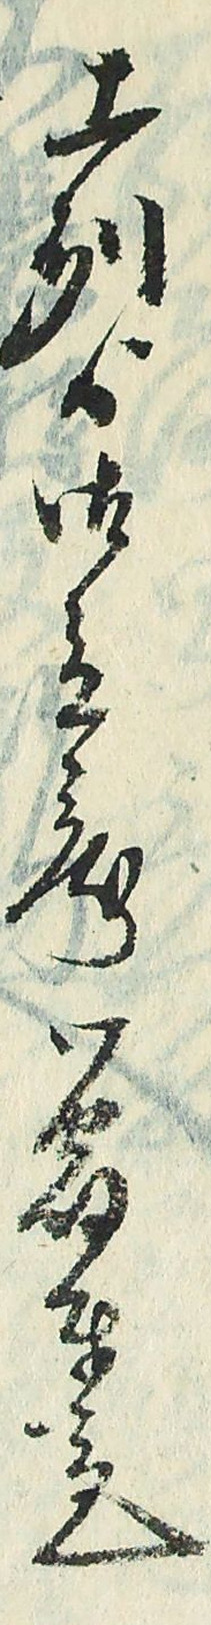土州ゟ御立戻御宿付覚
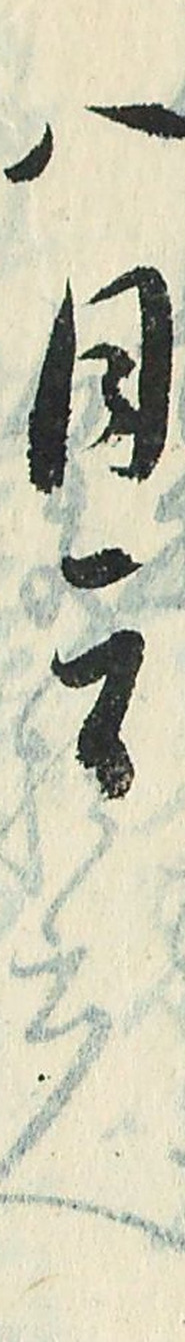八月二日
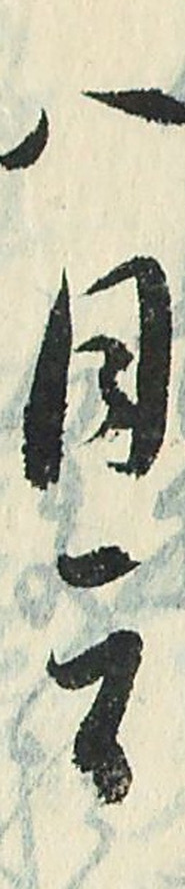八月二日
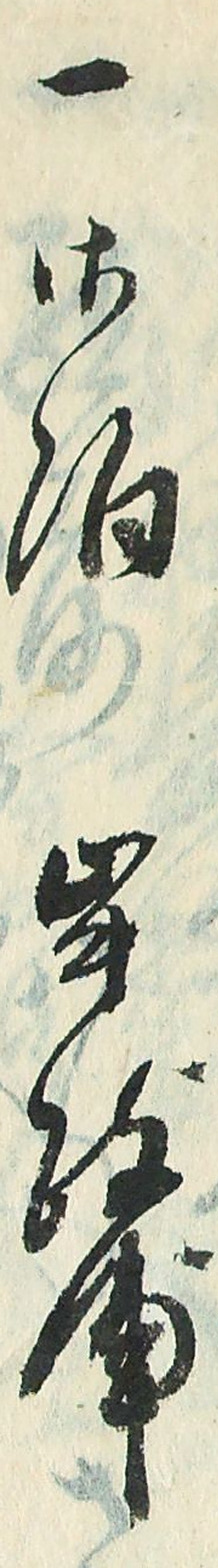一御泊牟岐浦

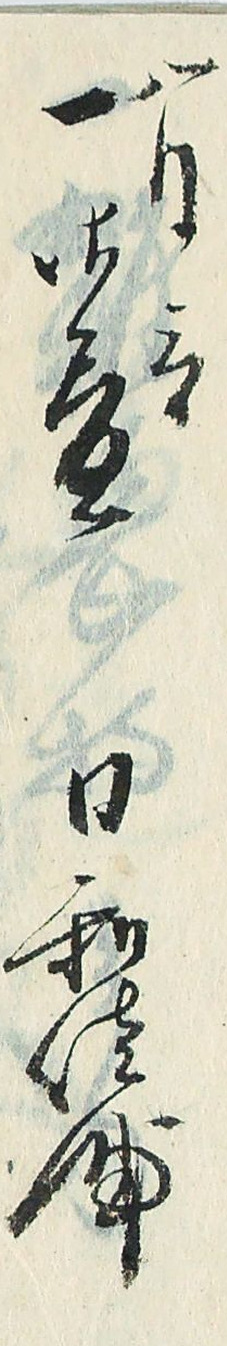一御昼日和佐浦
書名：公辺御役人為御廻浦御立越諸御用一巻
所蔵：鳴門教育大学 Naruto University of Education
